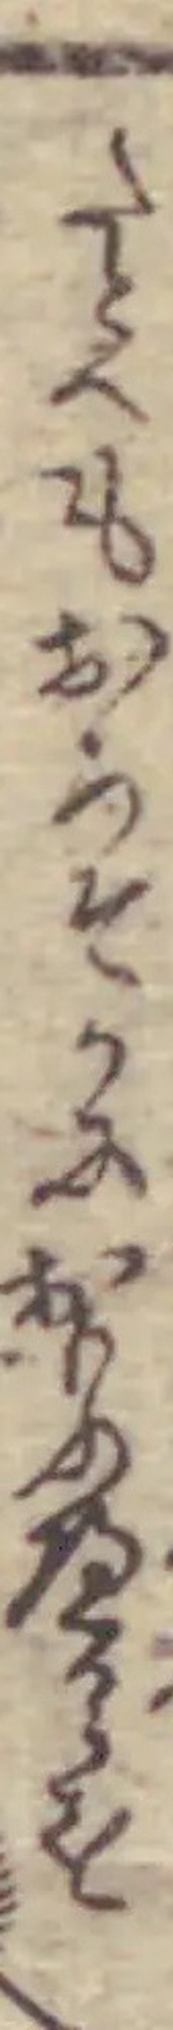たとへもおろそかにおもふへからす
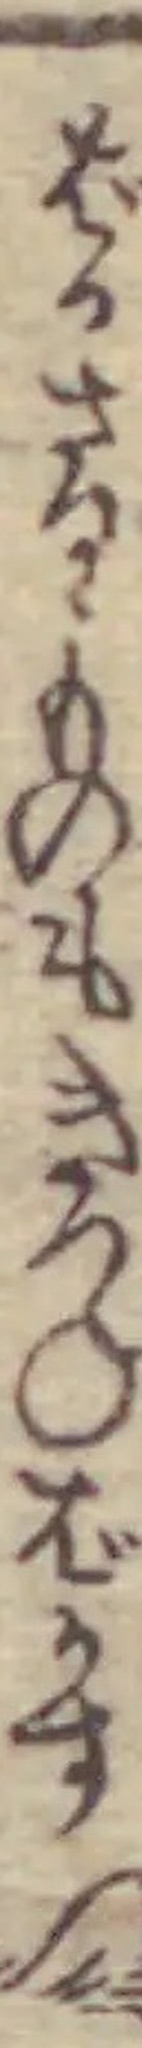ばかさるゝものもきつねばかす
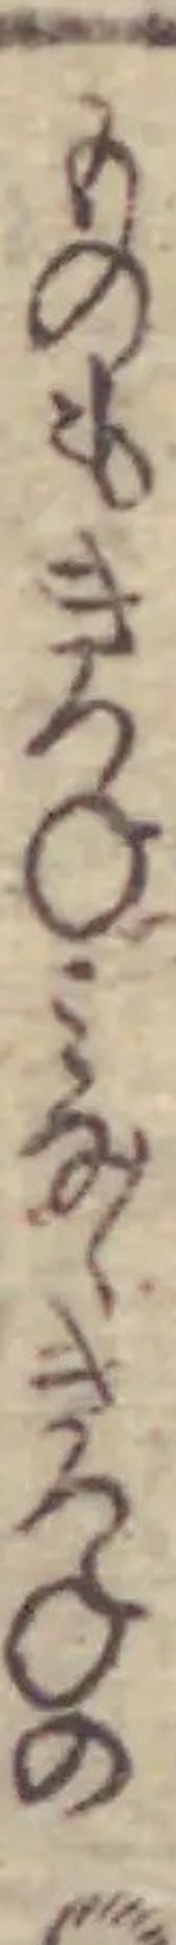ものもきつねみな〳〵きつねの
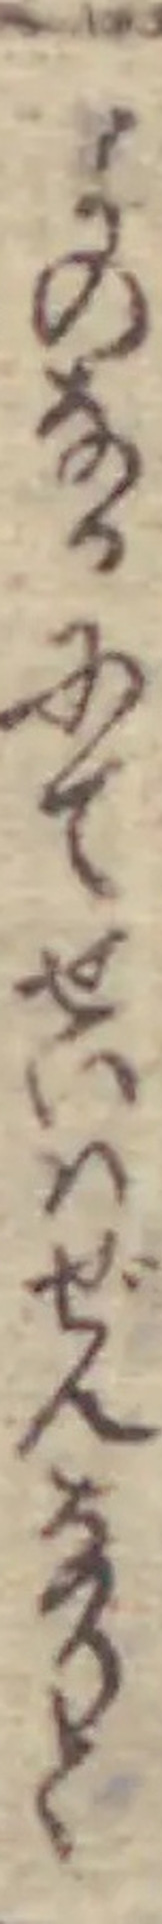よのなかにてせいはぜんなりと
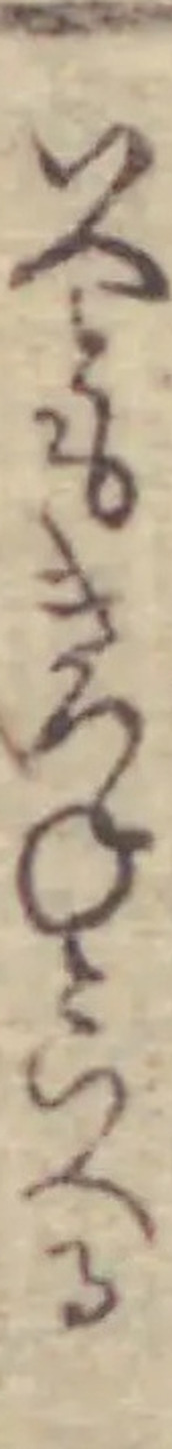いへともきつねといへる
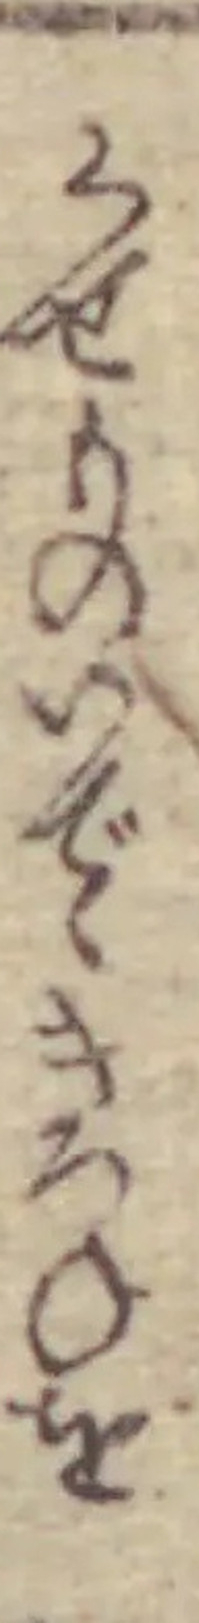くせものいでゝきつねを
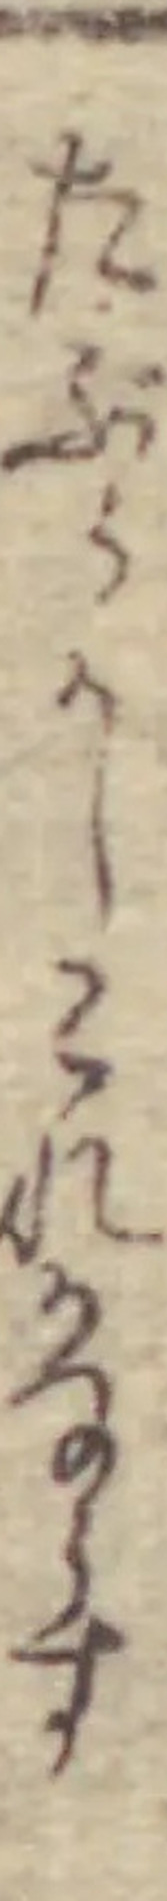たぶらかしこれかならす
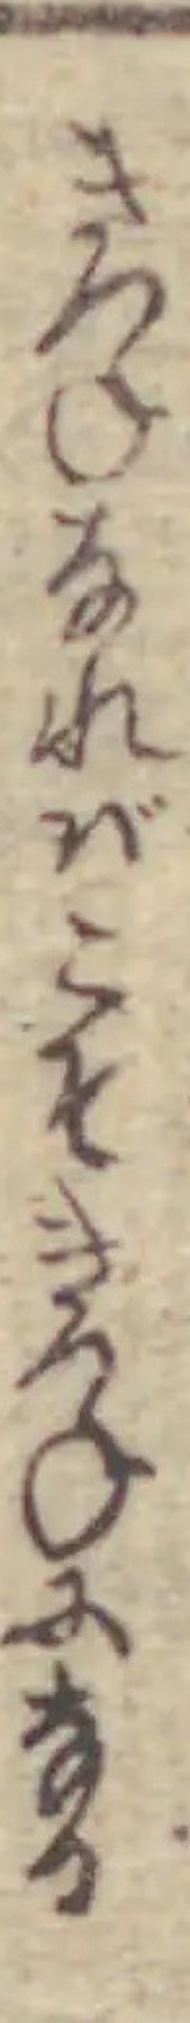きつねなればこそきつねになる
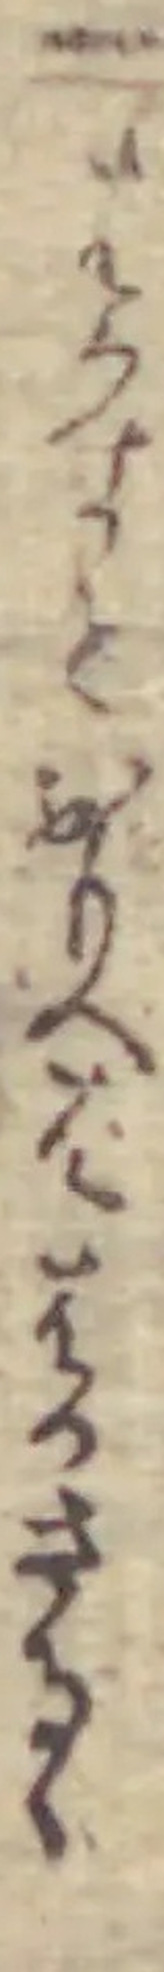はかすとおもへばはかさるゝ
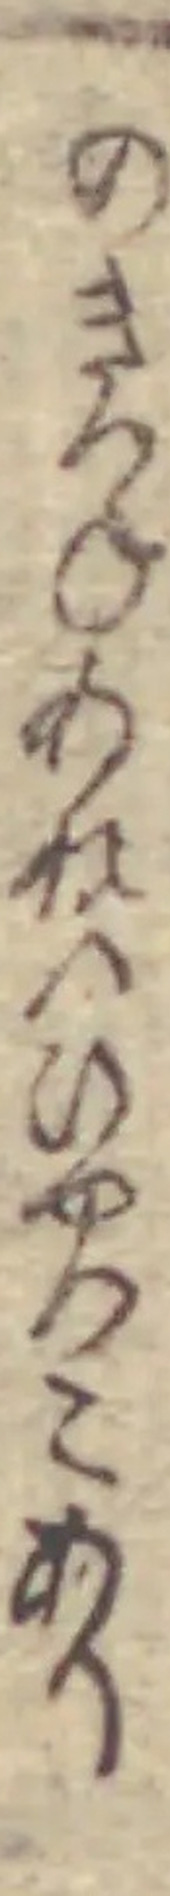のきつねあれはひやつこあり
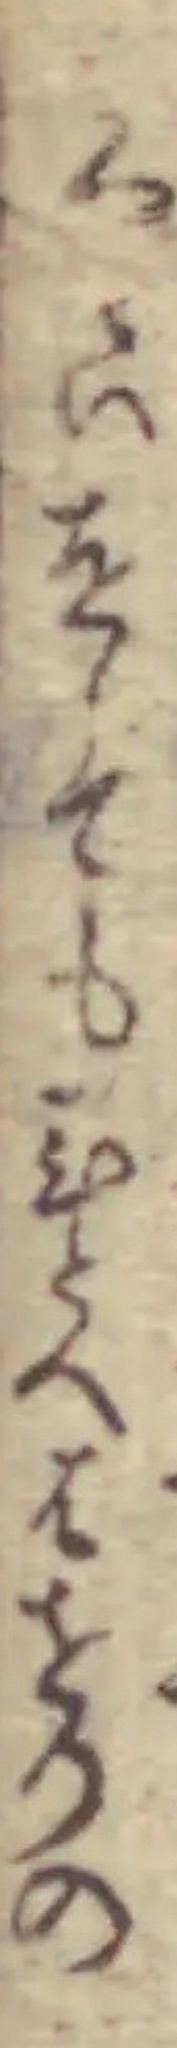くういをしてもひとへはをりの
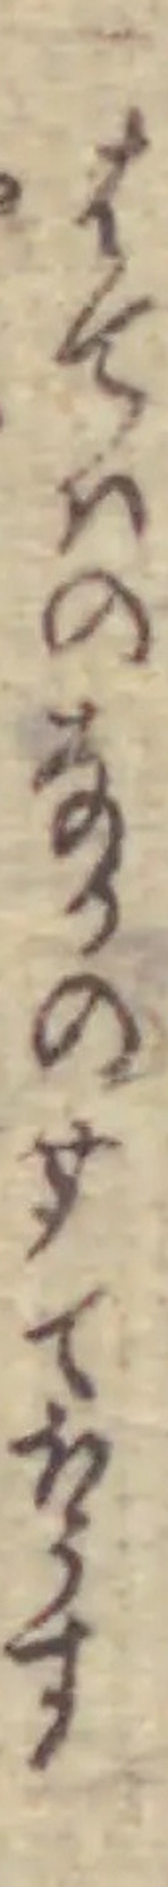はてはのなかのてほうす
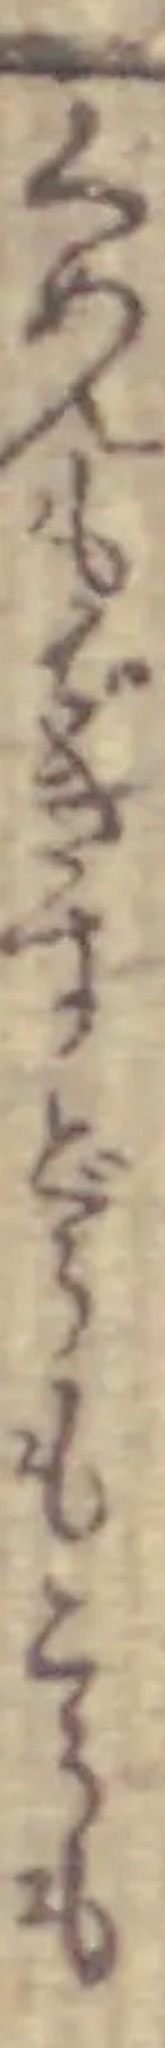くめんもできすどうもこうも
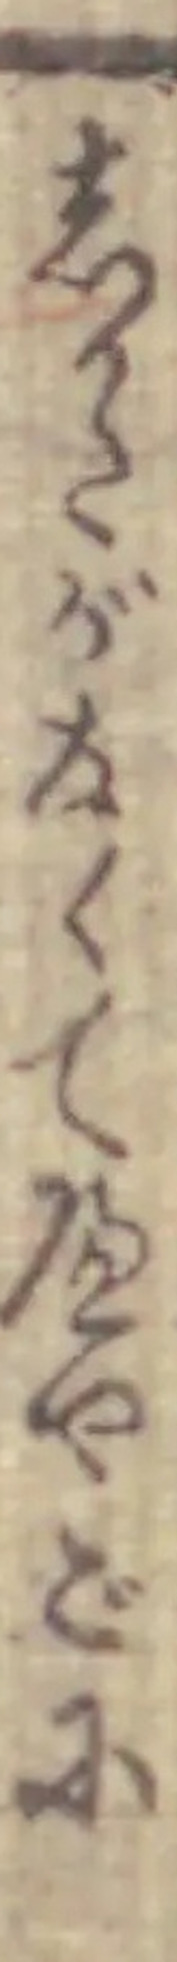しかたがなくてへやごに
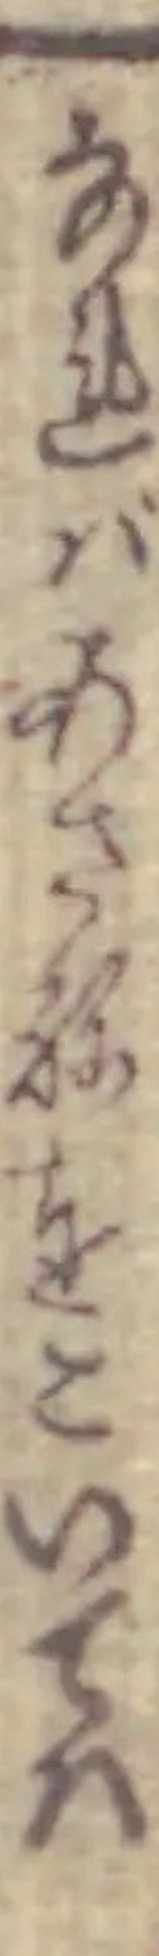なればあさねをこいては
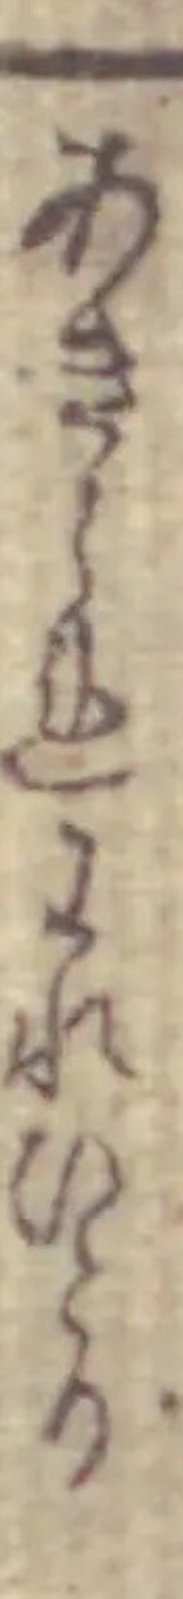あきられわれひとり
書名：夜野中狐物 2巻
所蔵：国立国会図書館 National Diet Library, JAPAN
